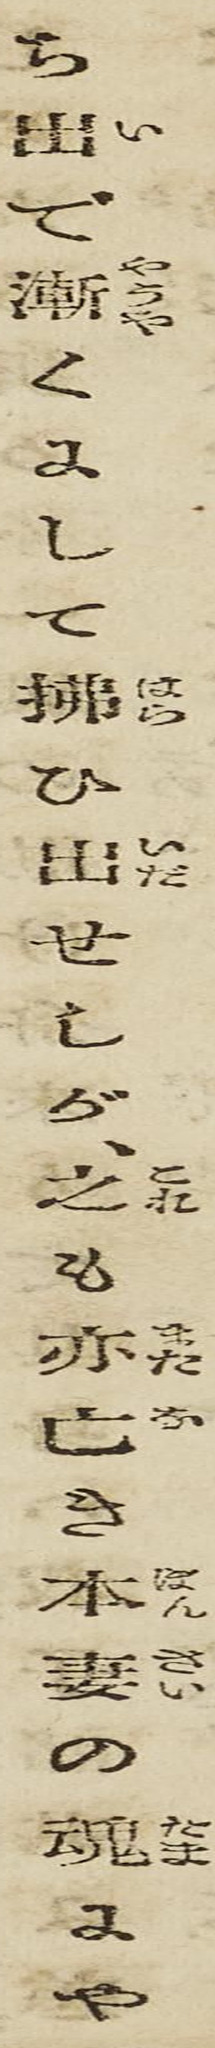ち出で漸くにして払ひ出せしが、之も亦亡き本妻の魂にや
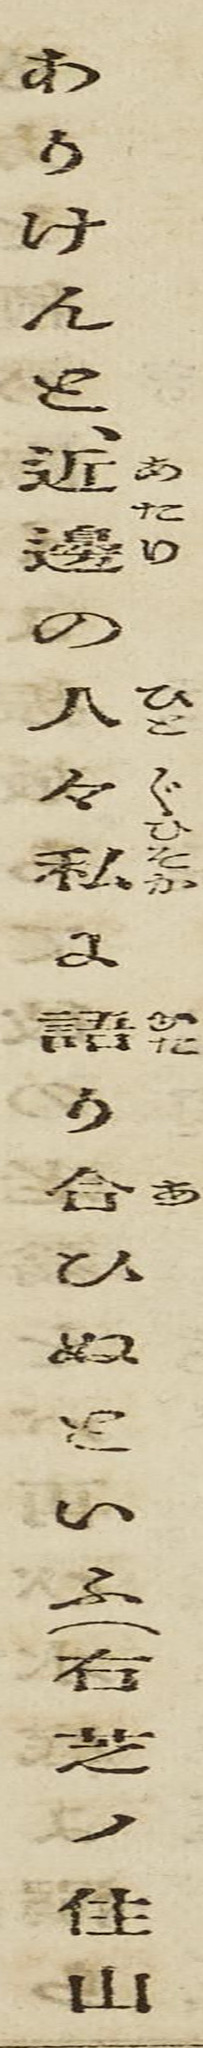ありけんと、近辺の人々私に語り合ひぬといふ（右芝の住山
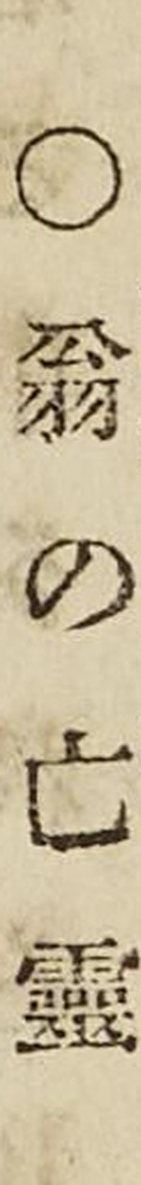○翁の亡霊
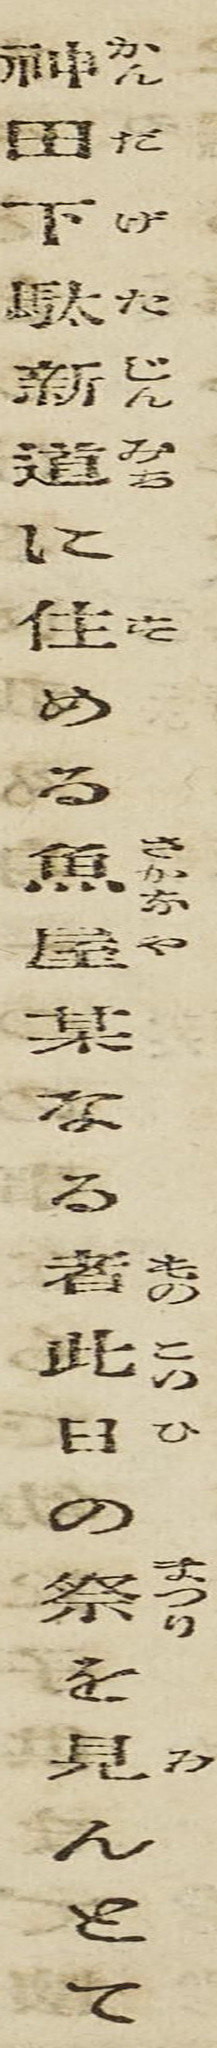神田下駄新道に住める魚屋某なる者此日の祭を見んとて
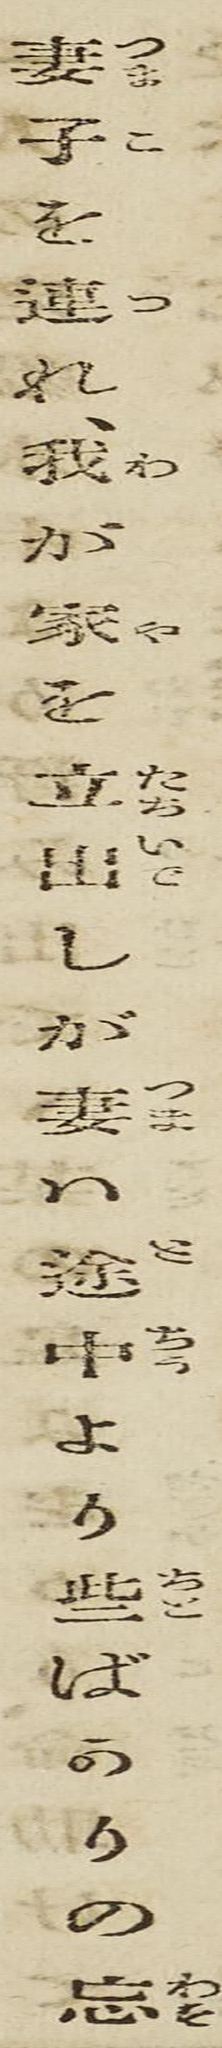妻子を連れ、我が家を立出しが妻は途中より些ばかりの忘
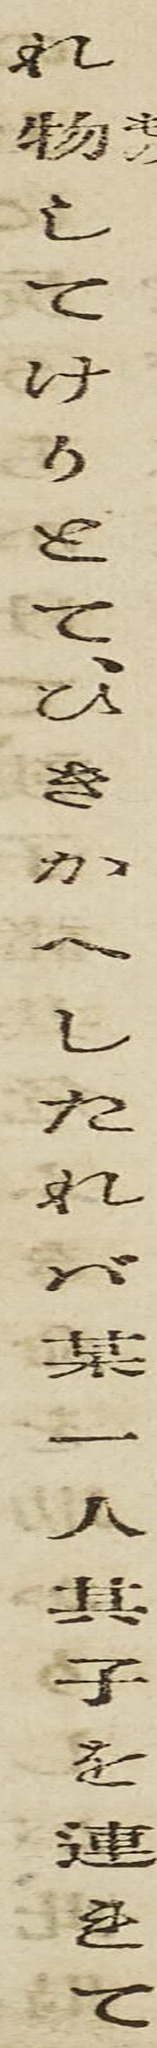れ物してけりとて、ひきかへしたれば某一人其子を連れて
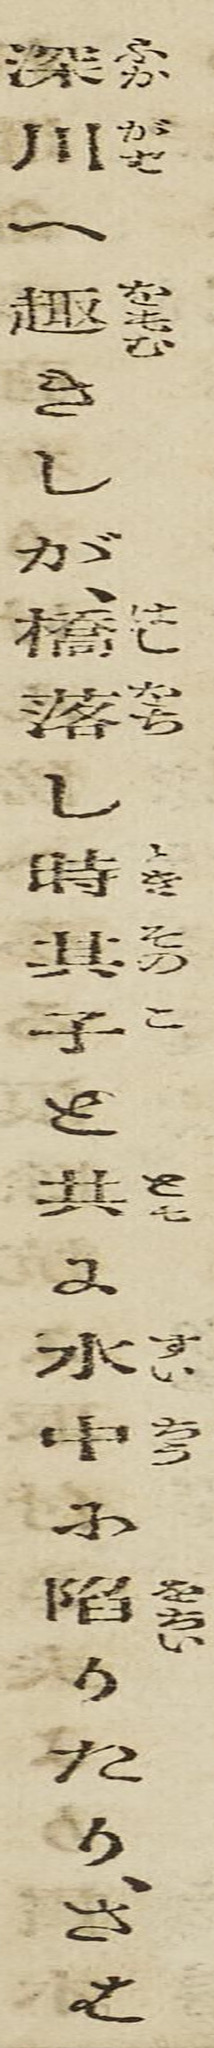深川へ趣きしが、橋落し時其子と共に水中に陥りたり、さは

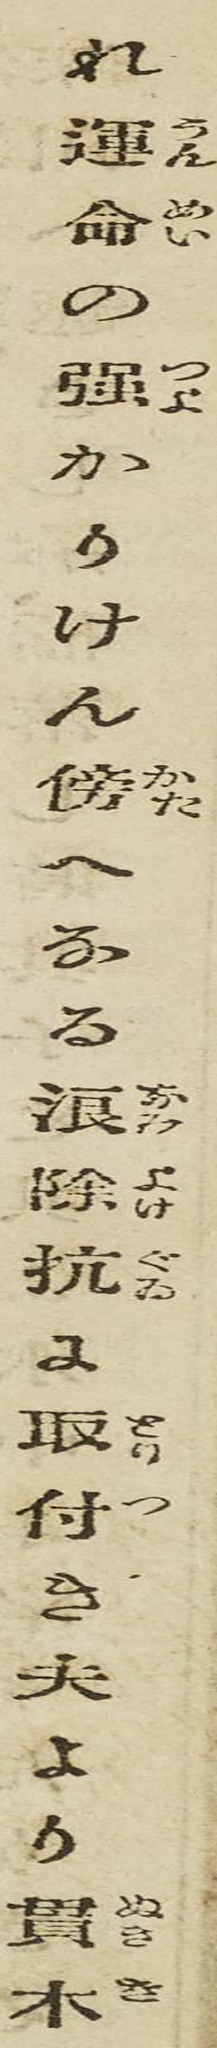れ運命の強かりけん傍へなる浪除杭に取付き夫より貫木
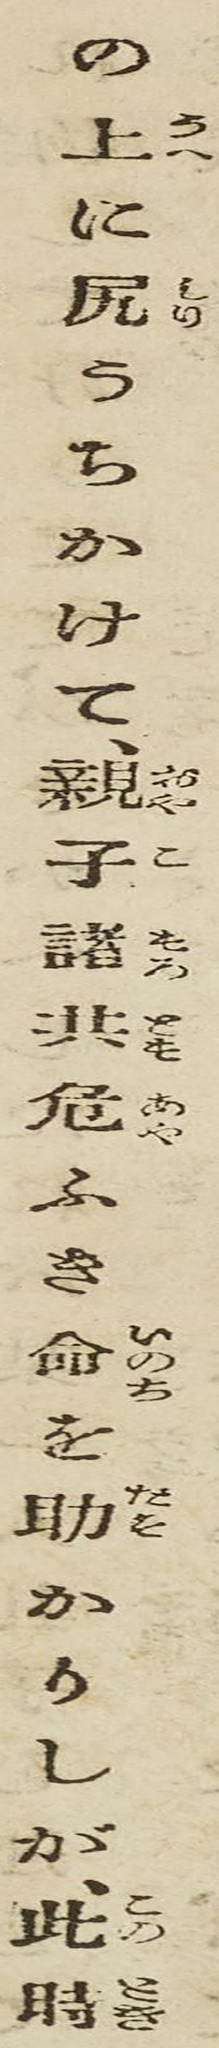の上に尻うちかけて、親子諸共危ふき命を助かりしが、此時
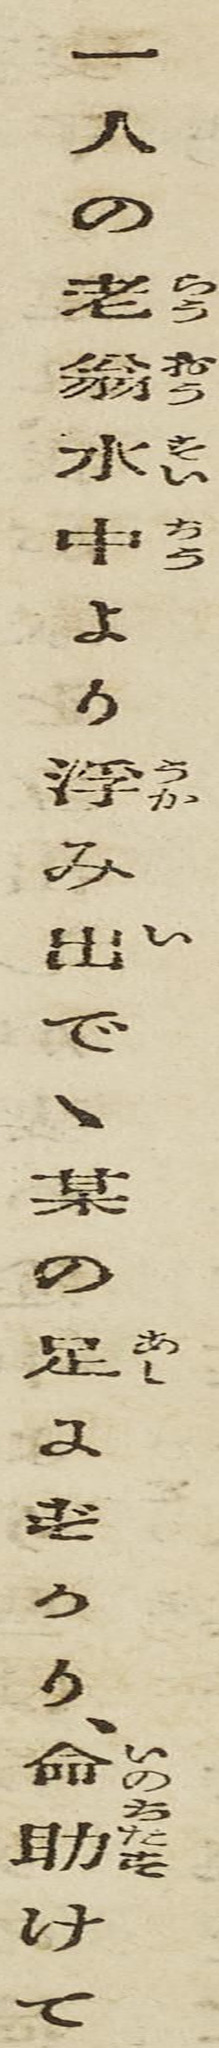一人の老翁水中より浮み出でゝ某の足にずかり、命助けて
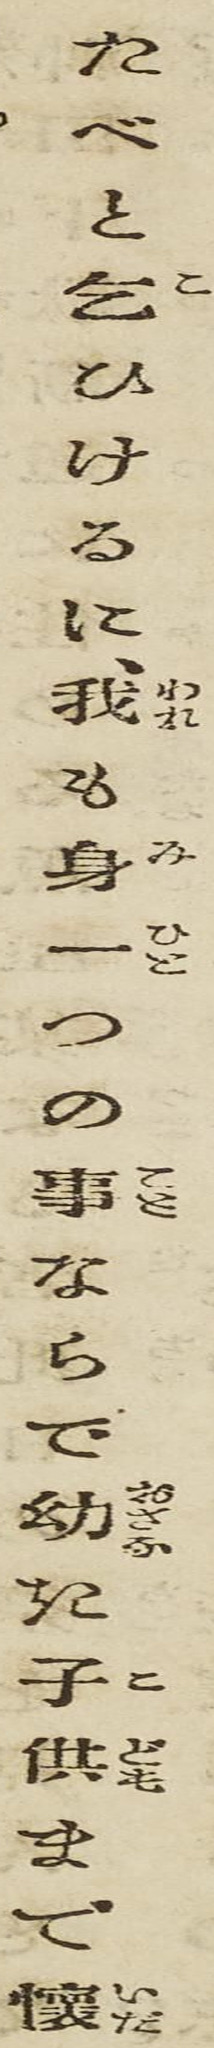たべと乞ひけるに、我も身一つの事ならで幼き子供まで懐
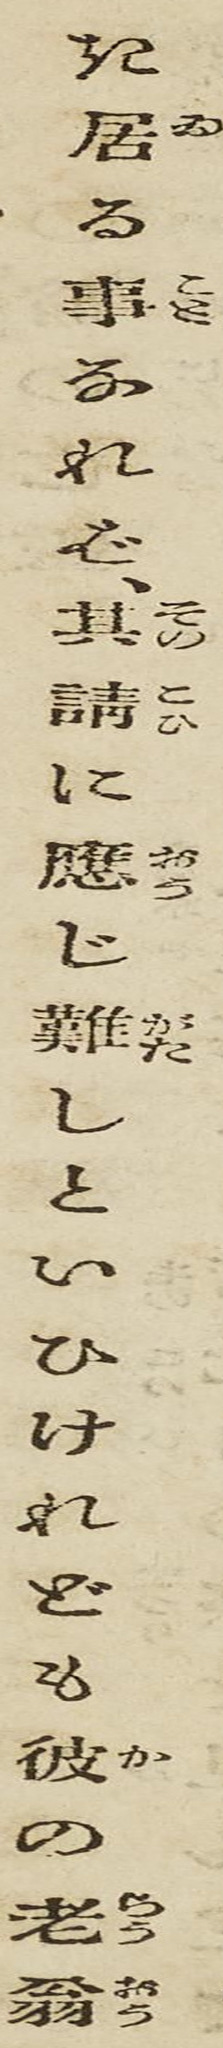き居る事なれば、其請に応じ難しといひけれども彼の老翁
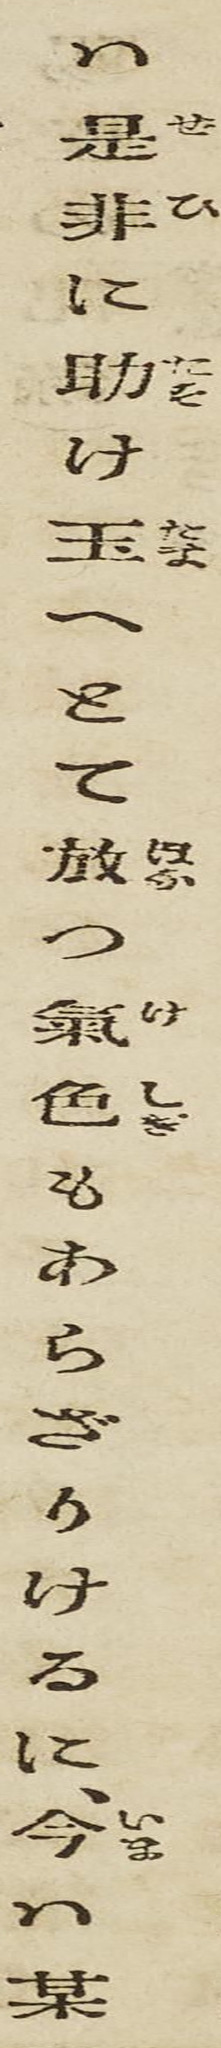は是非に助け玉へとて放つ気色もあらざりけるに、今は某
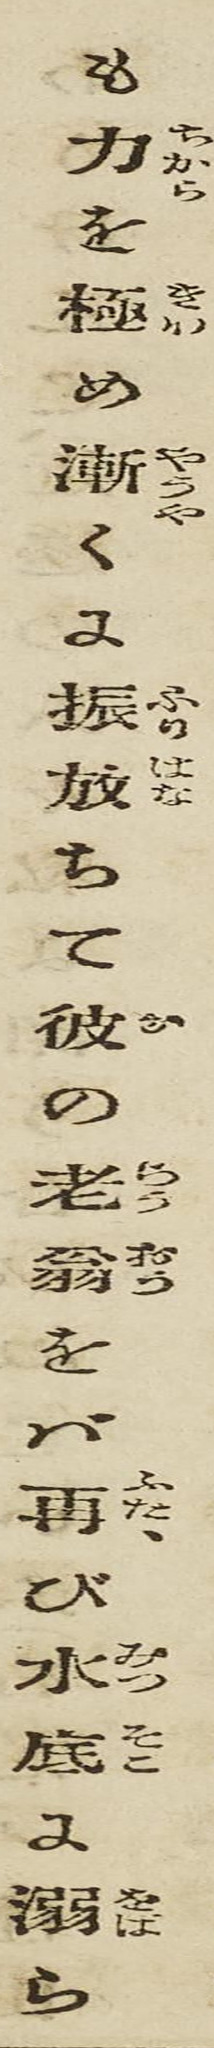も力を極め漸くに振放ちて彼の老翁をばび再水底に溺ら
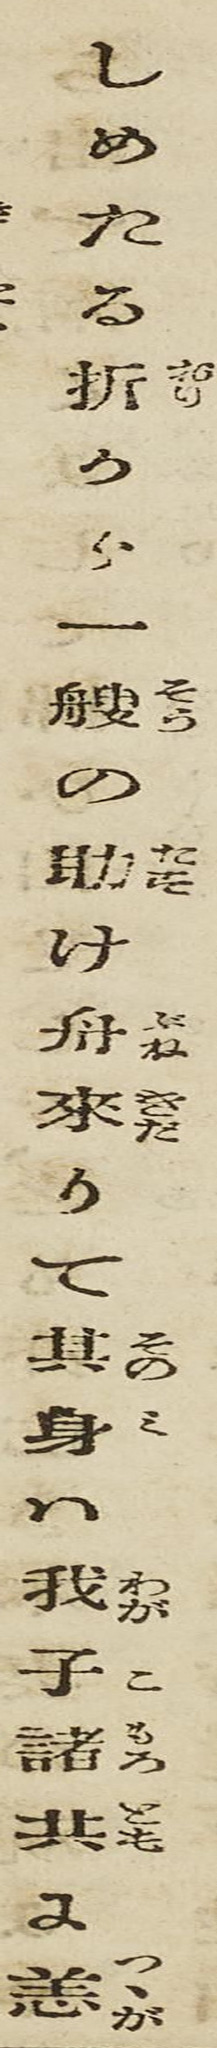しめたる折から一艘の助け舟来りて其身は我子諸共に恙
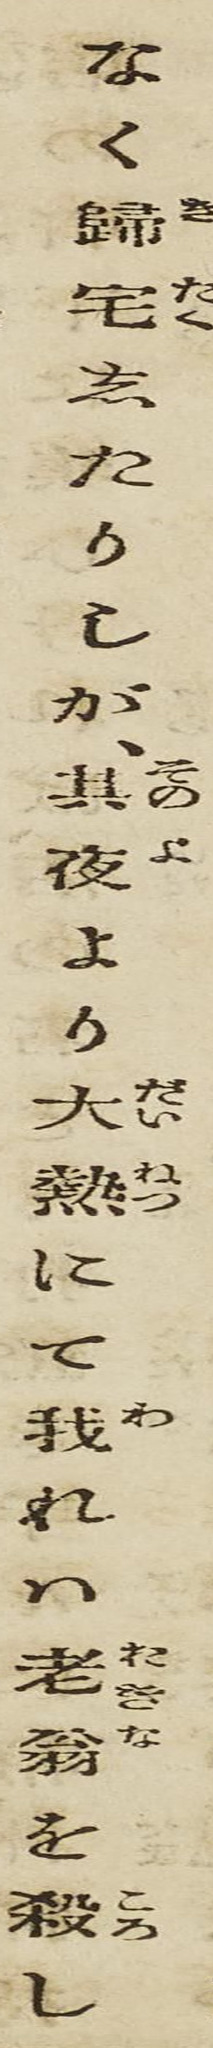なく帰宅したりしが、其夜より大熱にて我れは老翁を殺し
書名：永代惨話　文化の夢　全
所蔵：東京大学地震研究所図書室 Earthquake Research Institute Library, The University of Tokyo, JAPAN
